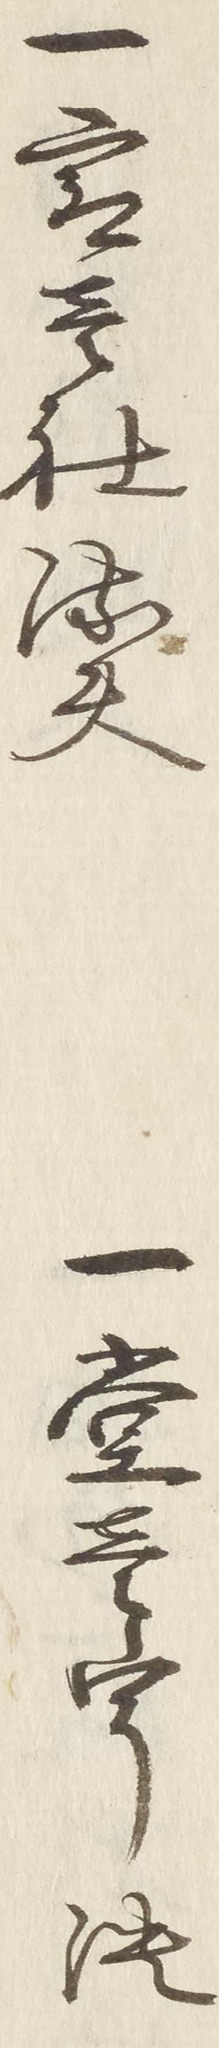一宮壱社流失一堂壱宇潰
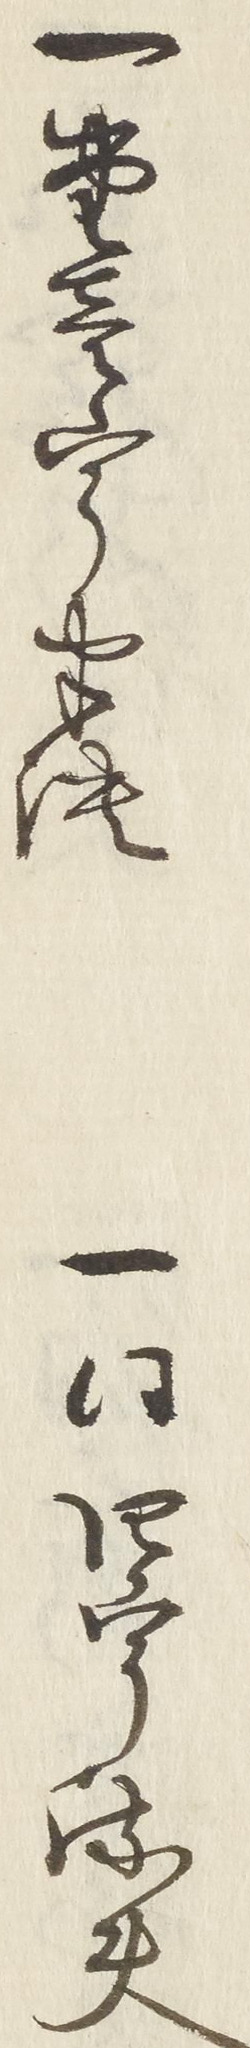一堂壱宇半潰一同四宇流失
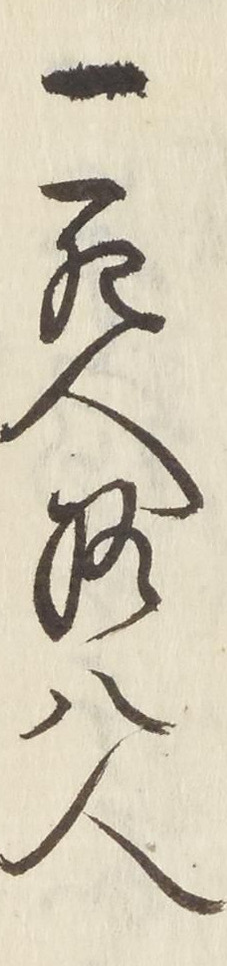一死人拾八人
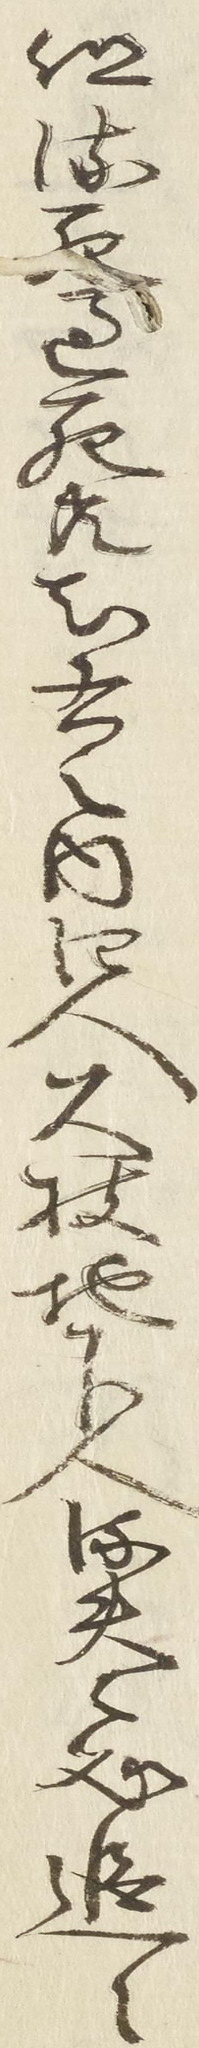但流死過死共前書之内四人久枝地下人流失候処追々
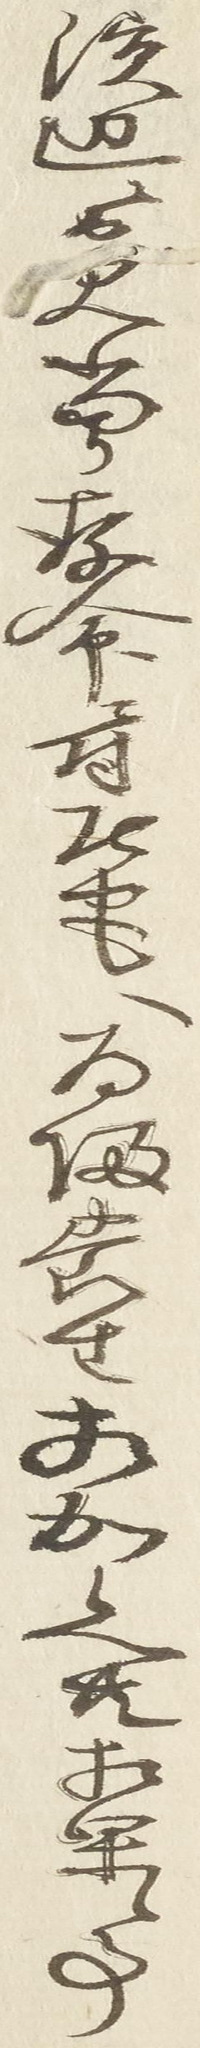浜辺二而見当り存命二付居宅へ為帰節さあからへ共相果候事
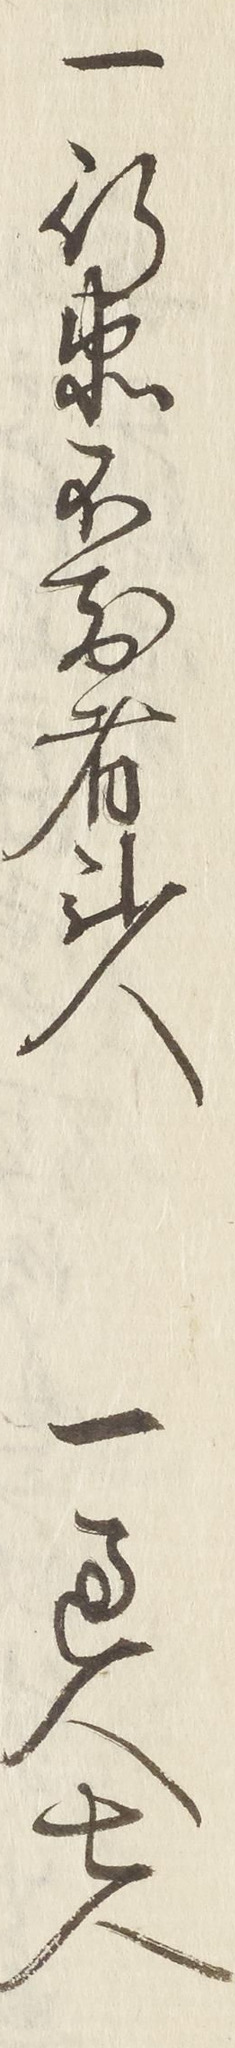一行衛不知者弐人一過人七人
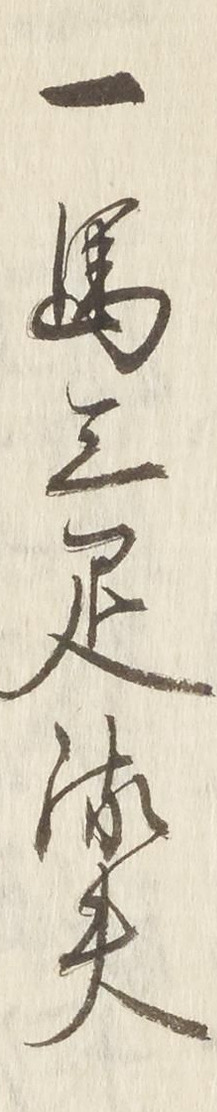一馬三疋流失
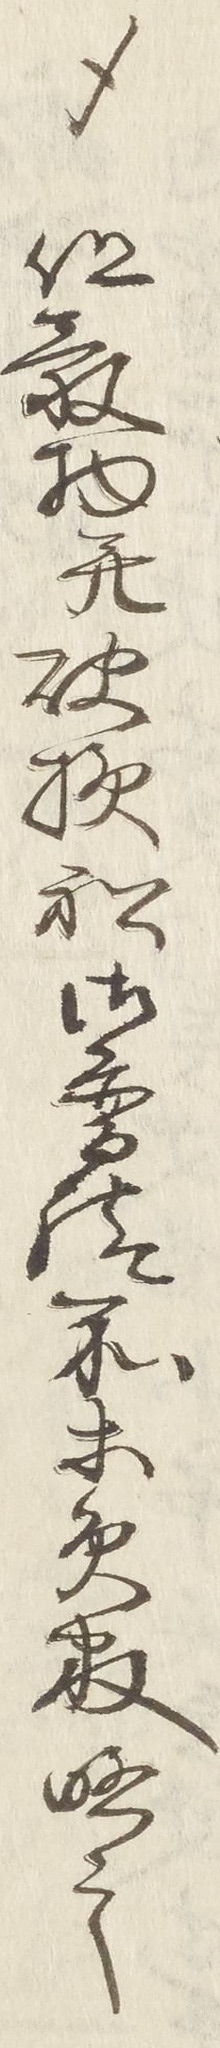〆但穀物共破損船御普請所等員数略之
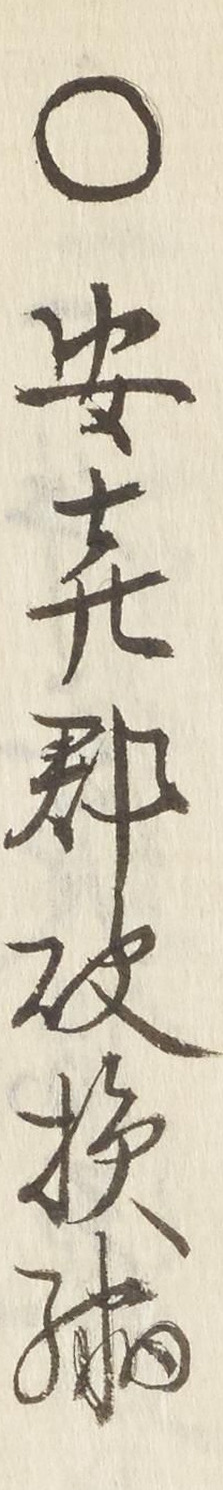◯安喜郡破損縮
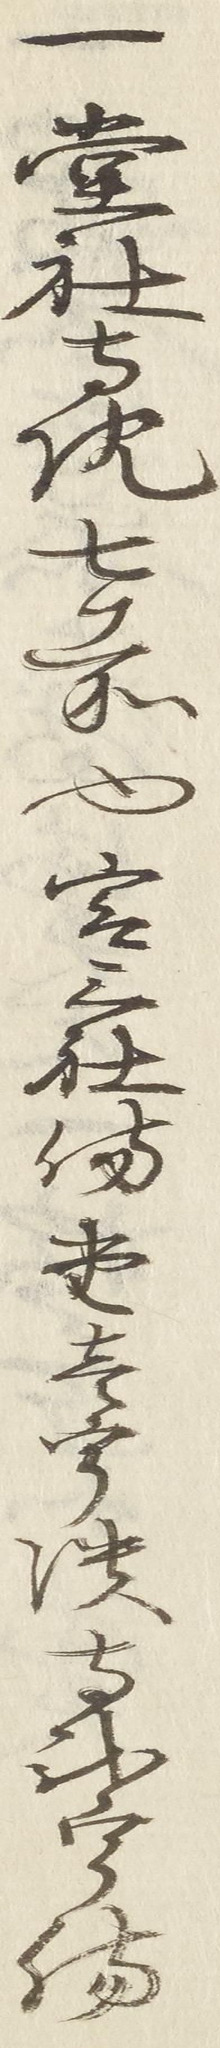一堂社寺院七ヶ所内宮三社傷堂壱宇潰寺弐宇傷
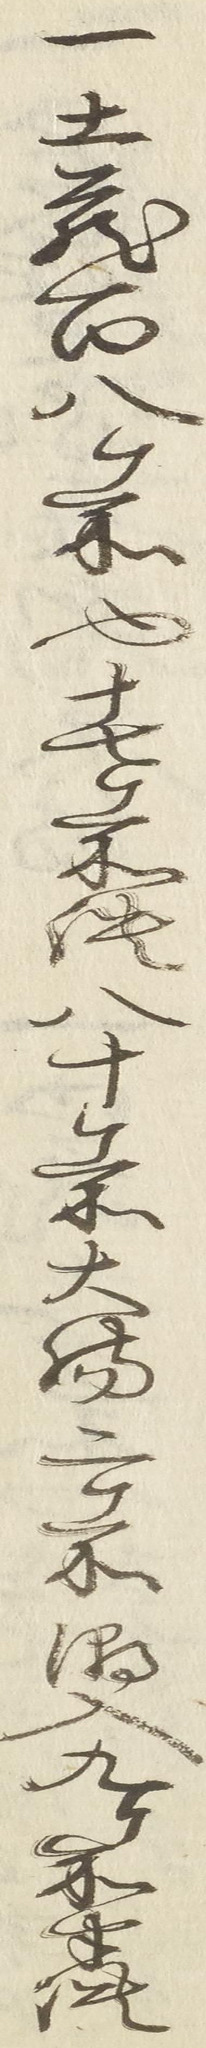一土蔵百八ヶ所内十七ヶ所潰八十ヶ所大傷二ヶ所潮入九ヶ所半潰
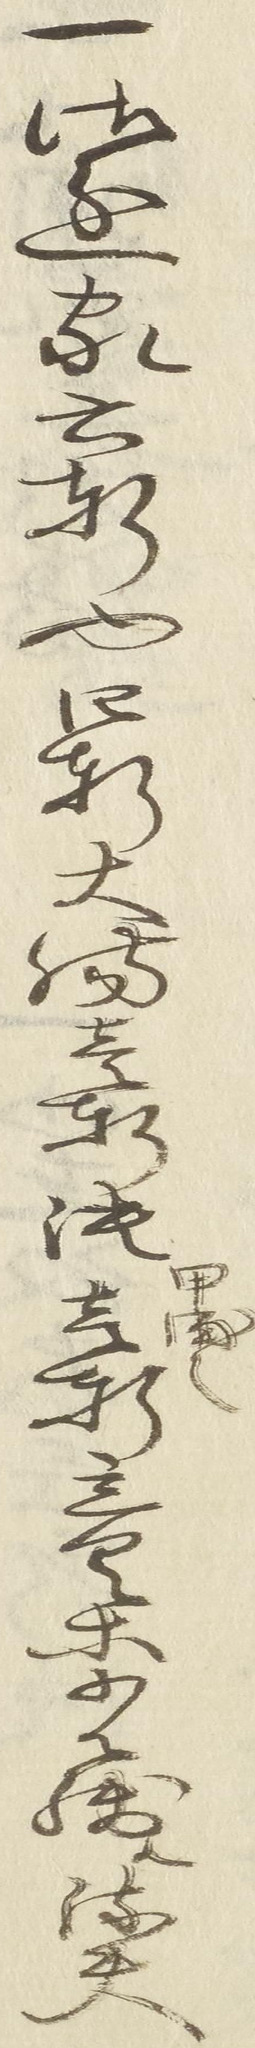一御分一家六軒内四軒大傷壱軒潰甲浦之壱軒立具等少々残ㇽ流失

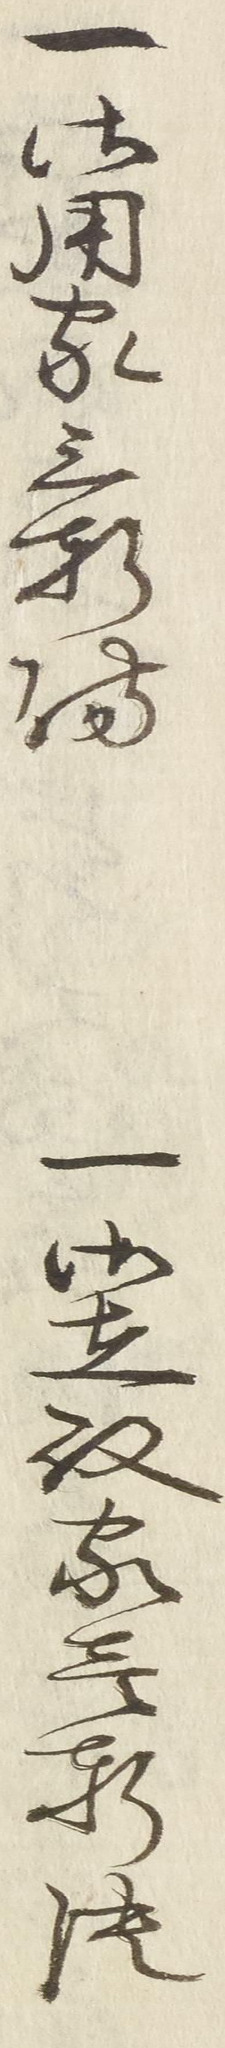一御用家三軒傷一御在役家壱軒潰
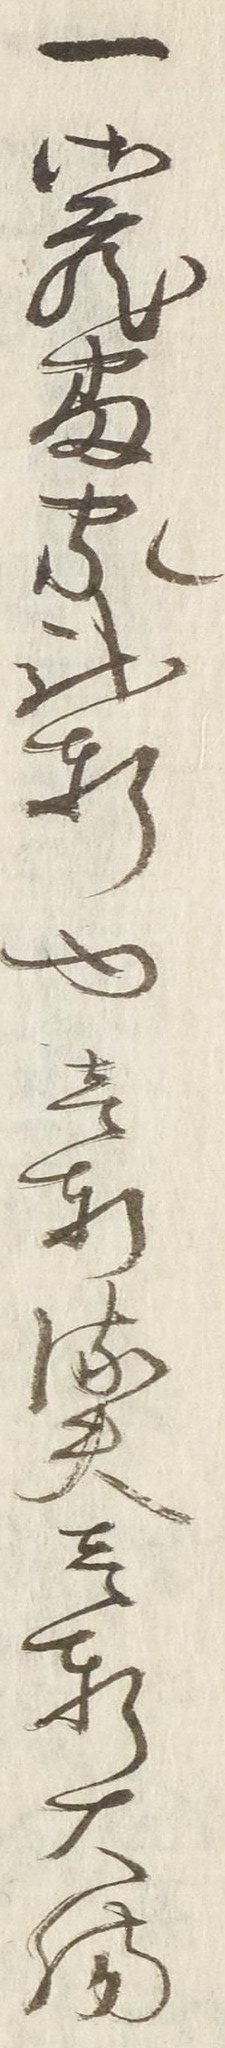一御蔵番家弐軒内壱軒流失壱軒大傷
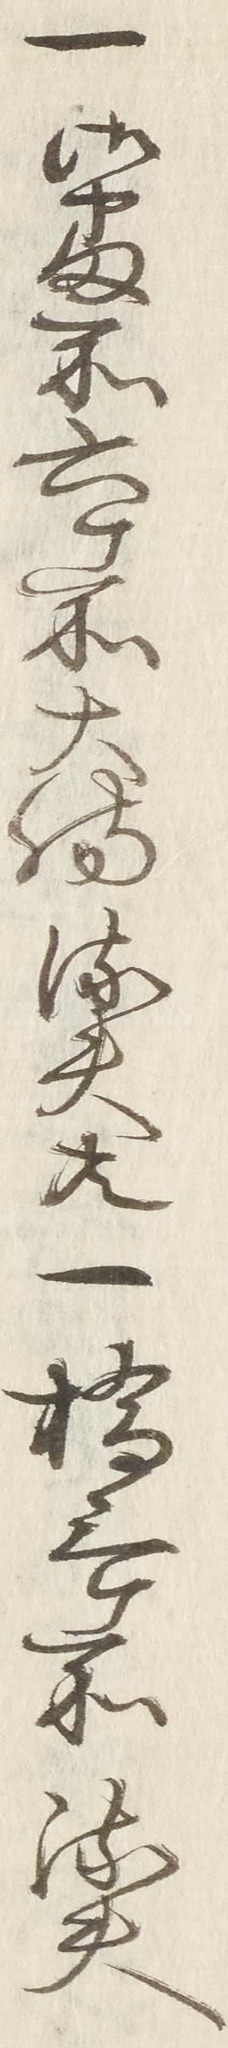一御番所六ヶ所大傷流失共一橋三ヶ所流失
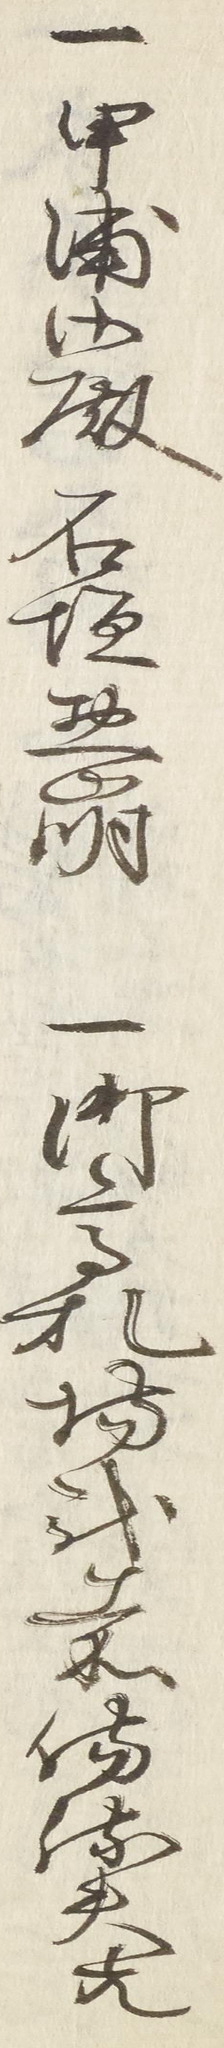一甲浦御殿石垣惣崩一御高札場弐ヶ所傷流失共
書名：地震記　下
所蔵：東京大学地震研究所図書室 Earthquake Research Institute Library, The University of Tokyo, JAPAN
